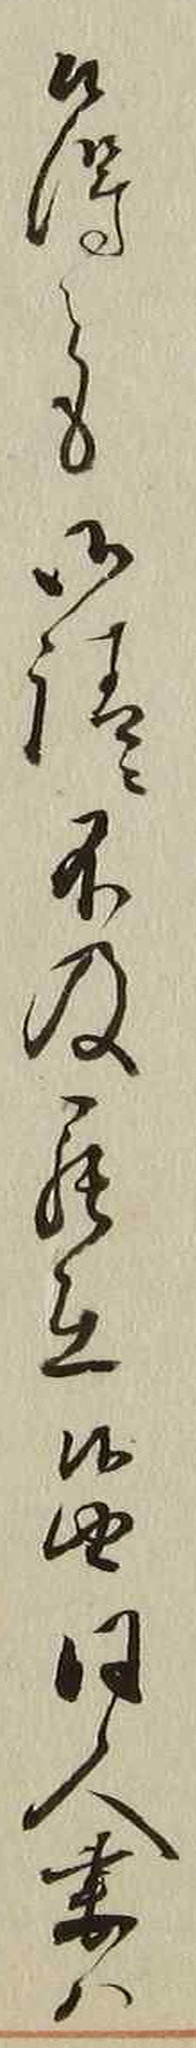候得とも御請ニ不及罷在候由同人妻ハ
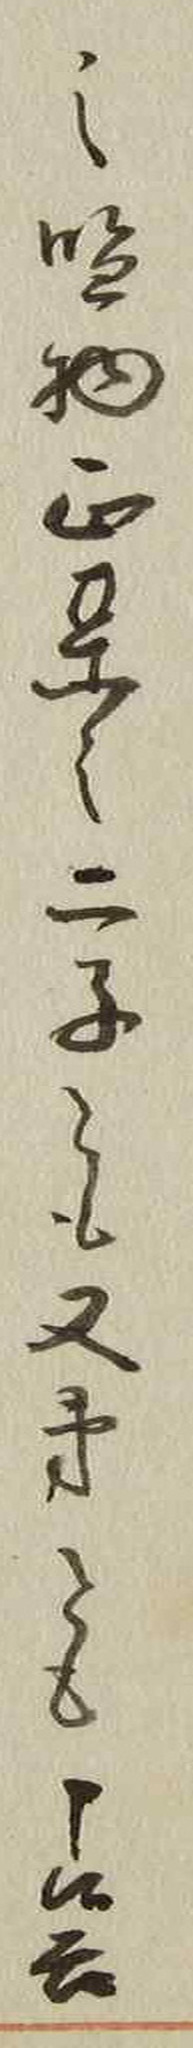之監物正某之二子とも又弟とも申候吉
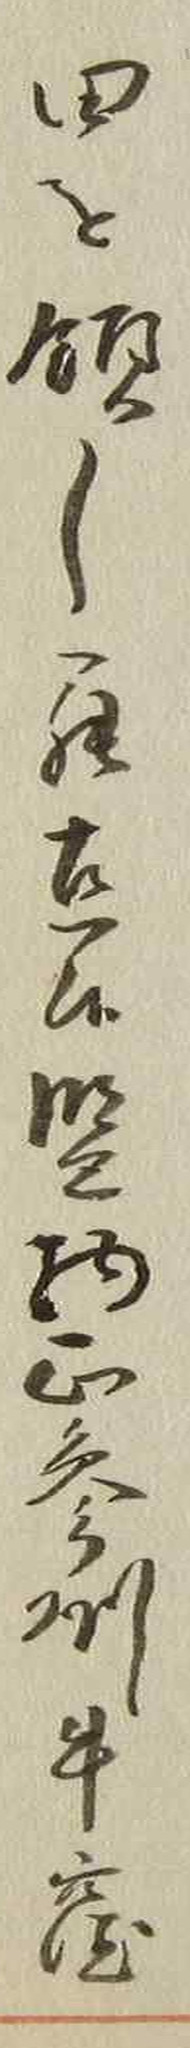田を領し罷在候監物正参州牛窪
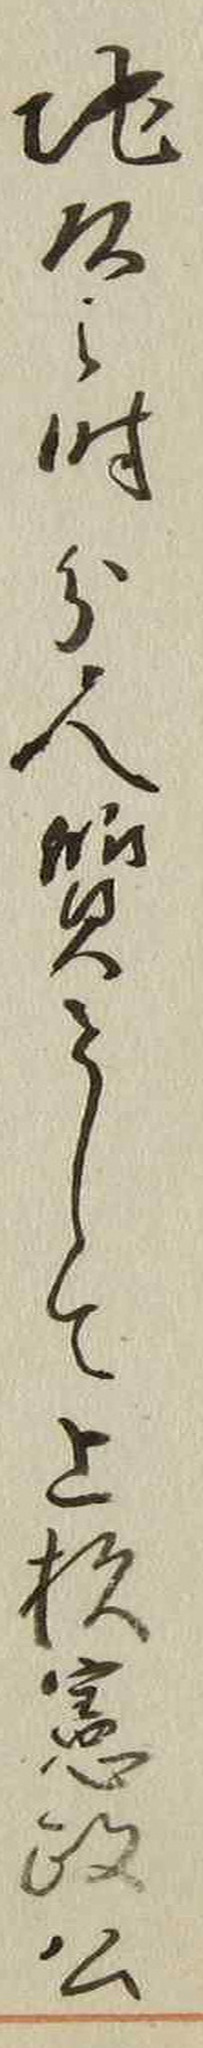地頭之時分人質として上杉憲政公
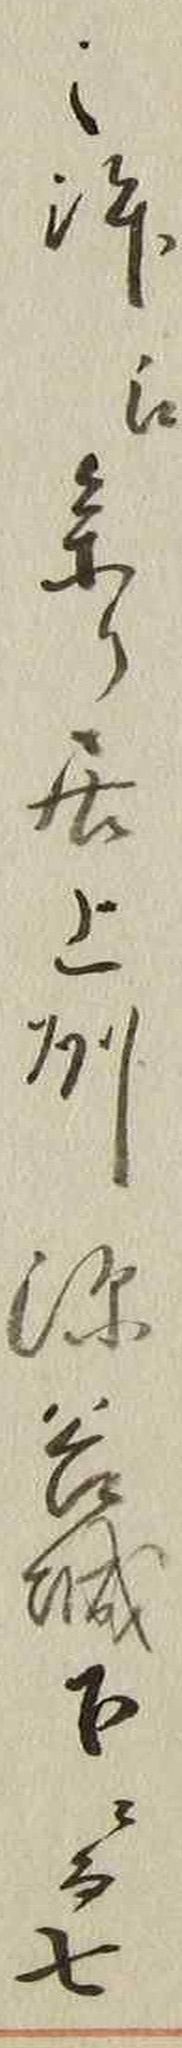之許江参り居上州深谷城下ニ而七
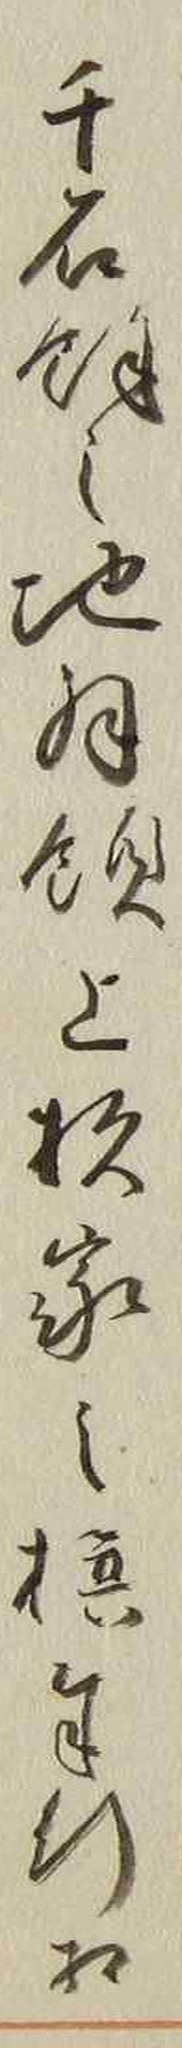千石余之地拝領上杉家之旗奉行相
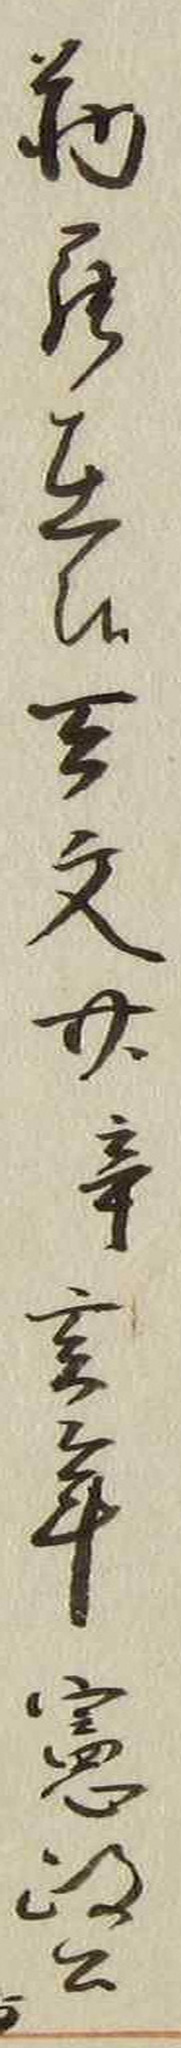勤罷在候天文廿辛亥年憲政公与
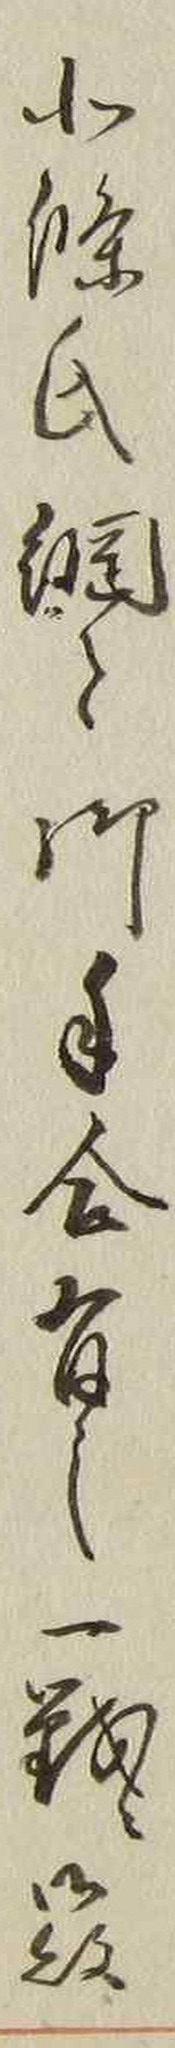北条氏綱と御手合有之一戦ニ御敗
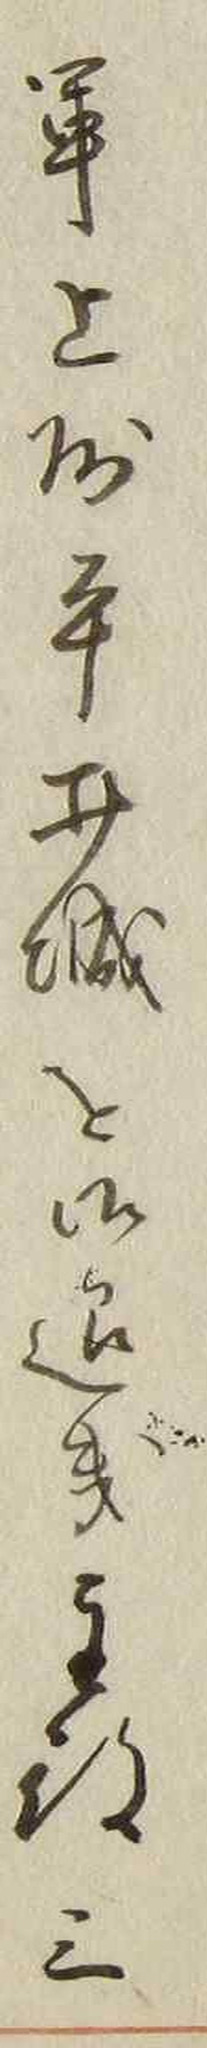軍上州平井城を御退義主役三
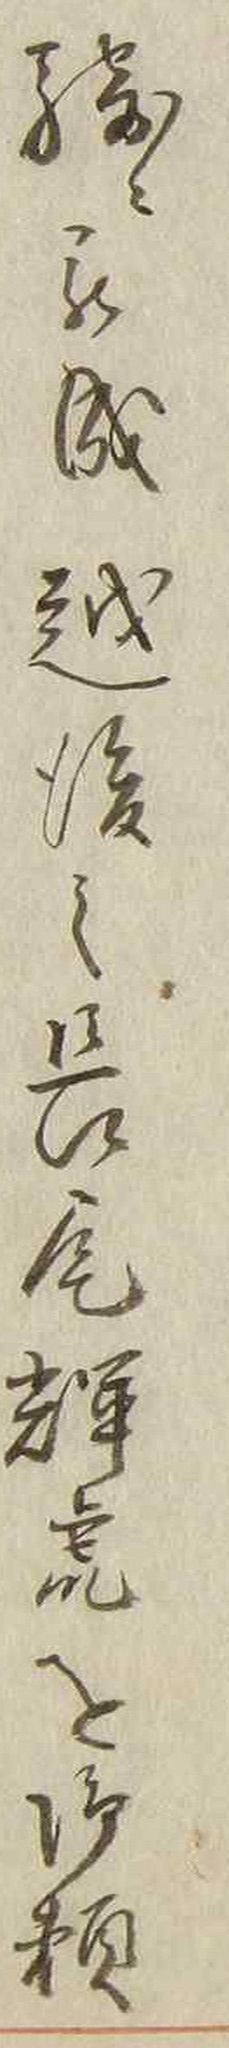騎ニ罷成越後之長尾輝虎を御頼

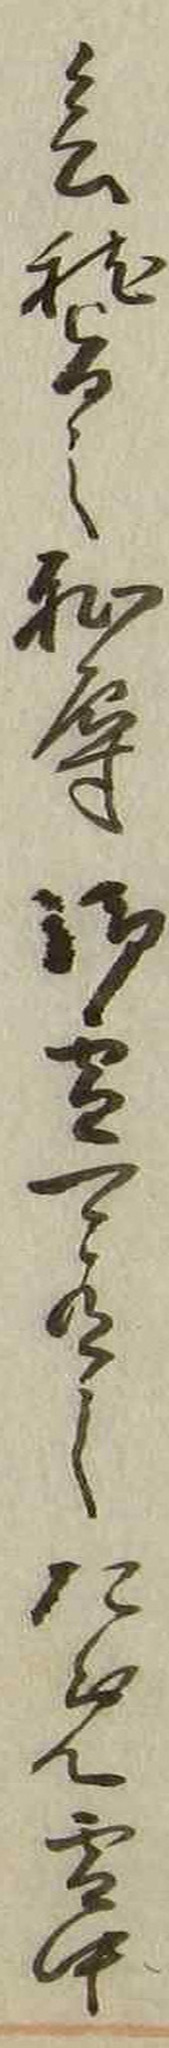会稽之和辱御雪可有之ため雪中
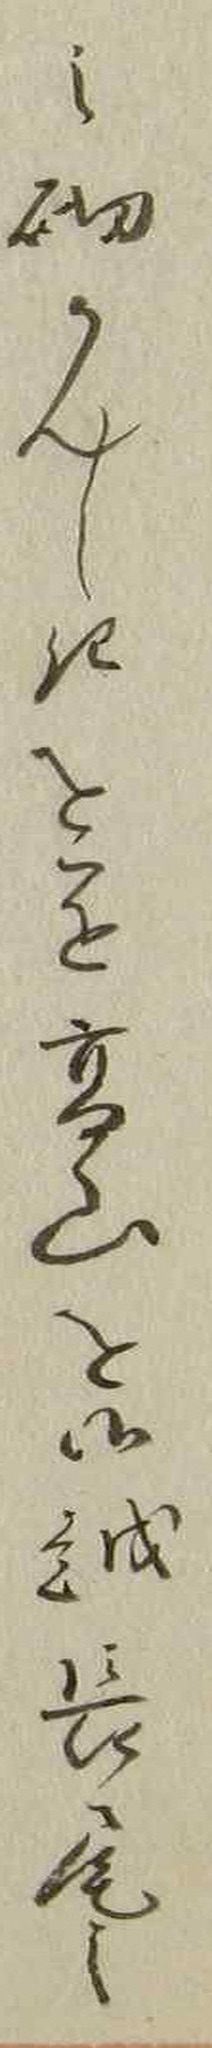之砌かんしきを懸高山を御越長尾之
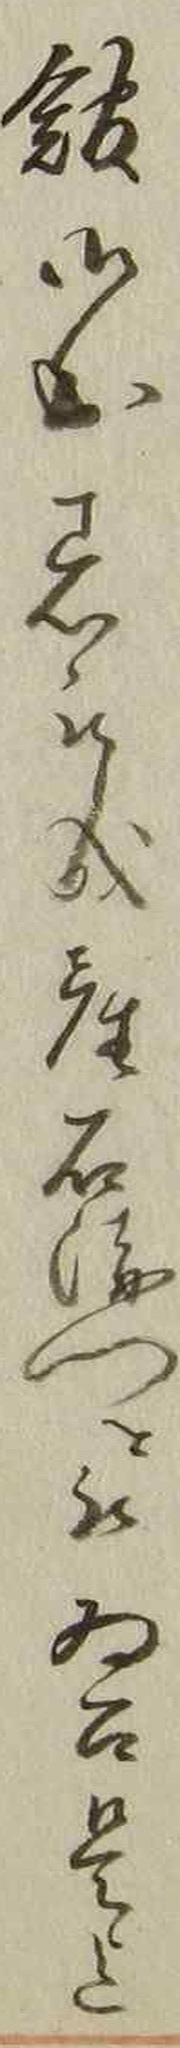館御到着被成産右衛門を被為召是迄
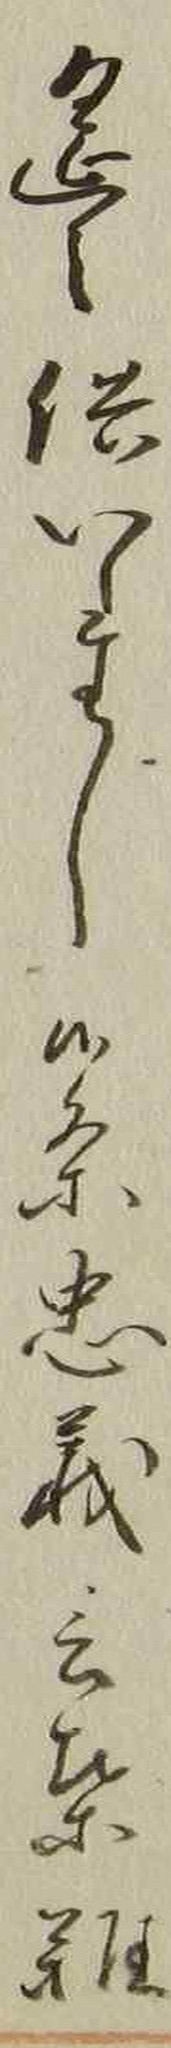遙之供いたし候条忠義言葉難
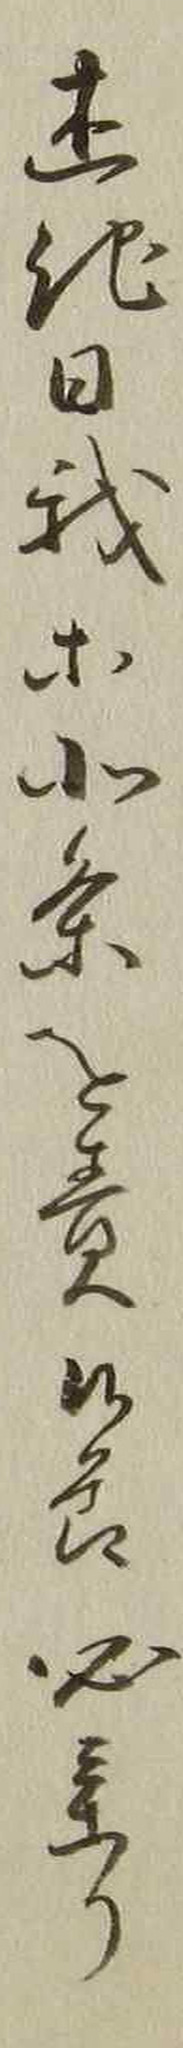述他日我等北条を責候節必参り
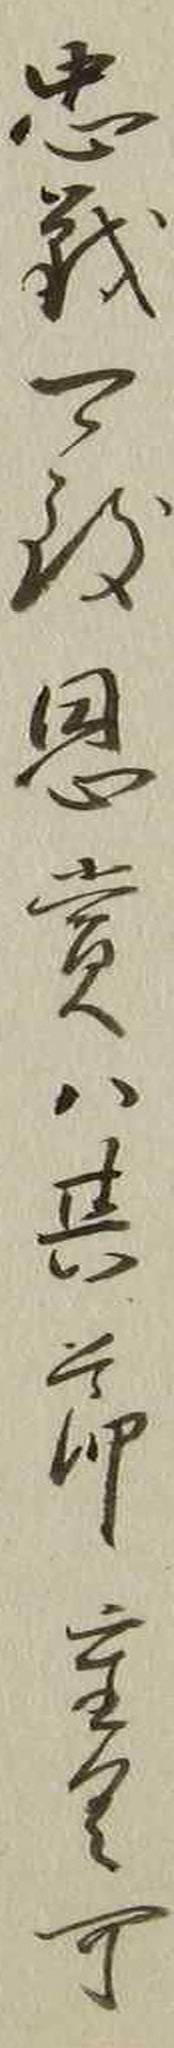忠義可致恩賞ハ其節重く可
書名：諸士系譜　巻之122　よ之部5
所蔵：会津若松市立会津図書館
